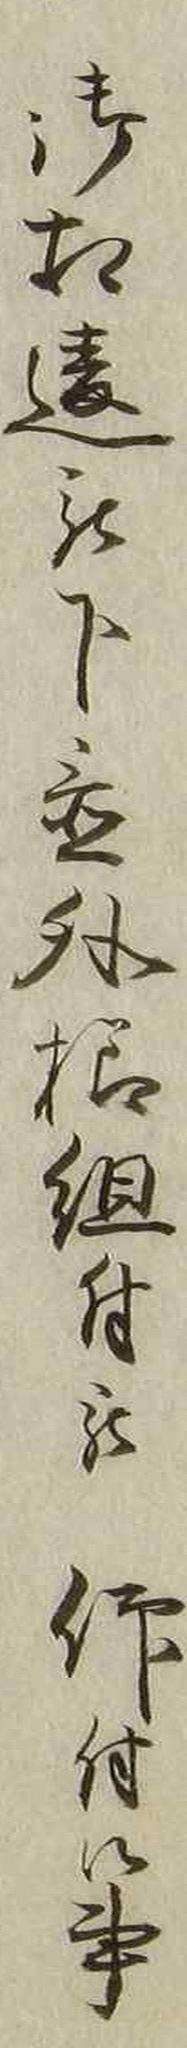御相違被下置外様組付被仰付候事
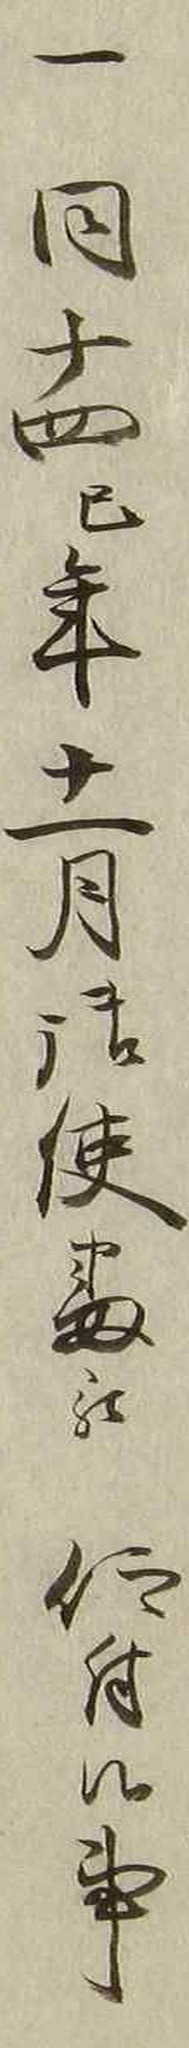一同十四巳年十一月御使番被仰付候事
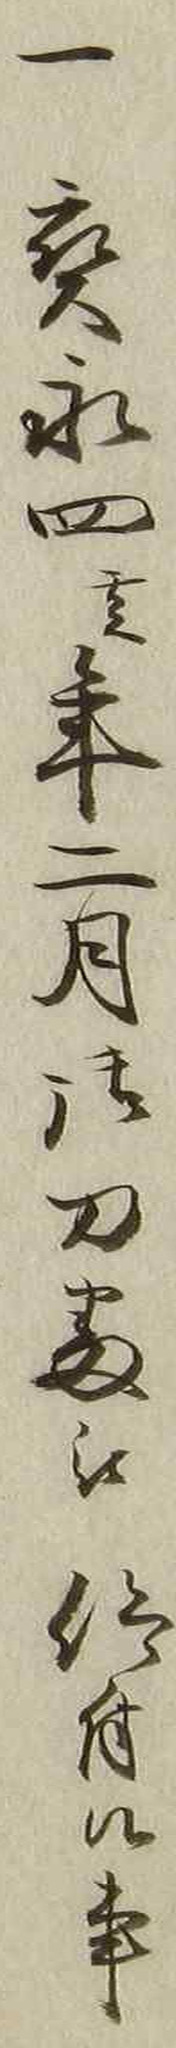一宝永四亥年二月御刀番被仰付候事
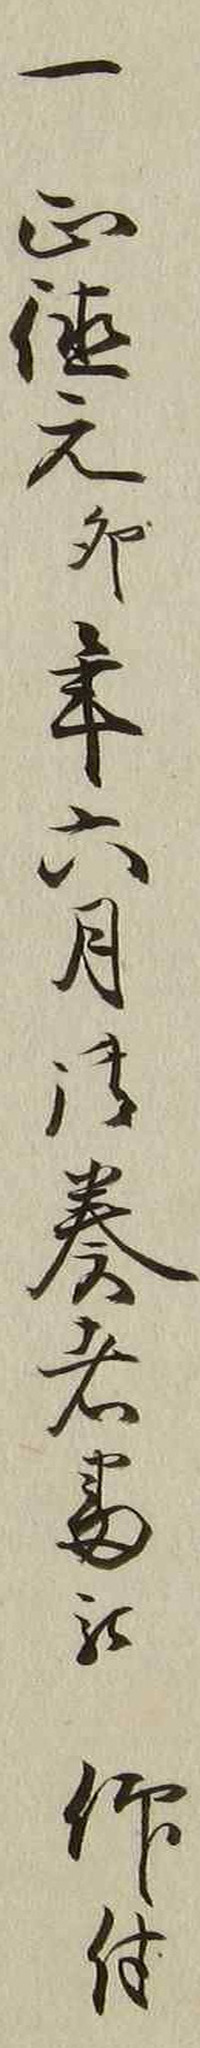一正徳元卯年六月御奏者番被仰付
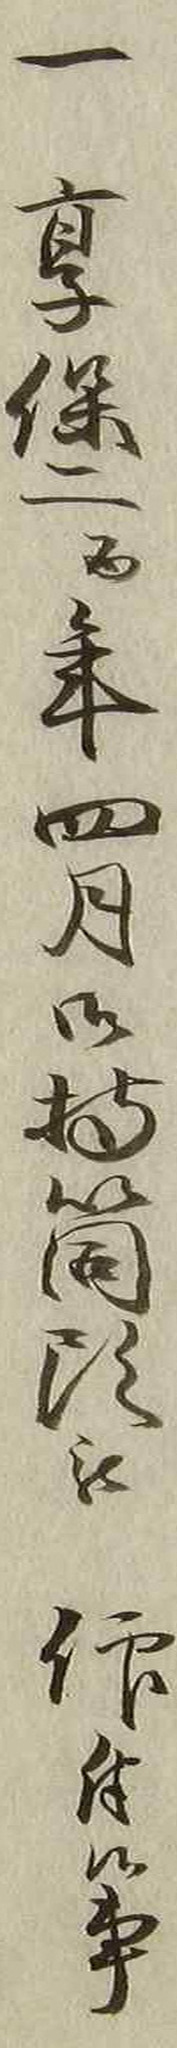一享保二酉年四月御持筒頭被仰付候事
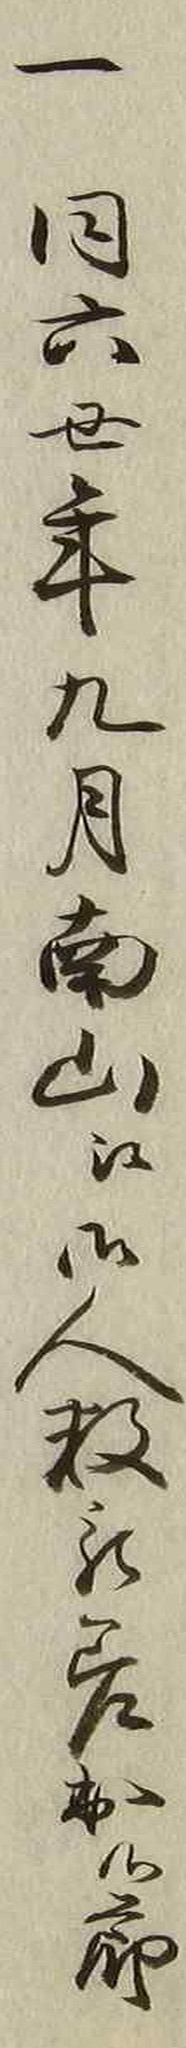一同六丑年九月南山江御人数被差出候節
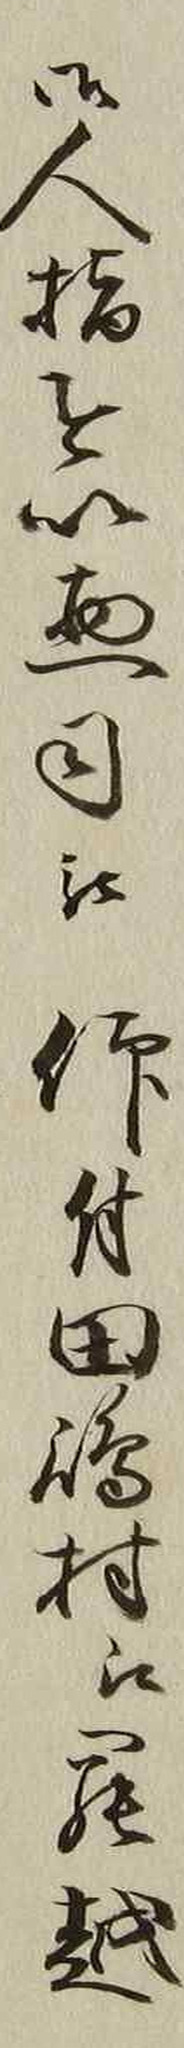御人指を以惣司被仰付田島村江罷越
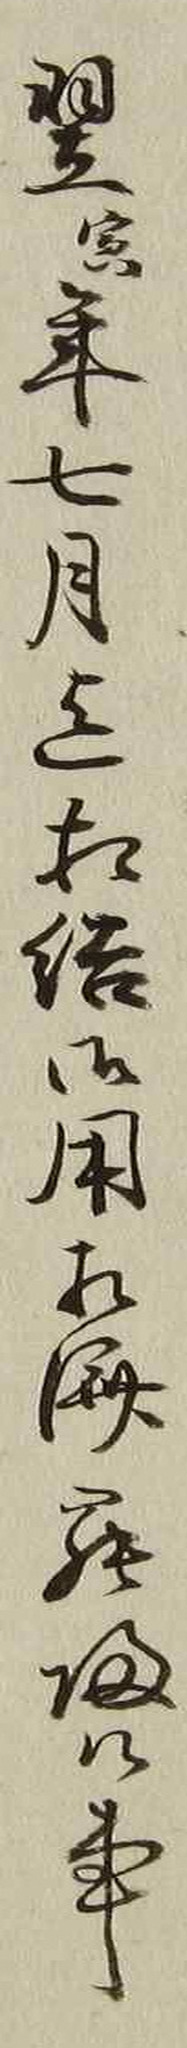翌寅年七月迄相結御用相済罷帰候事
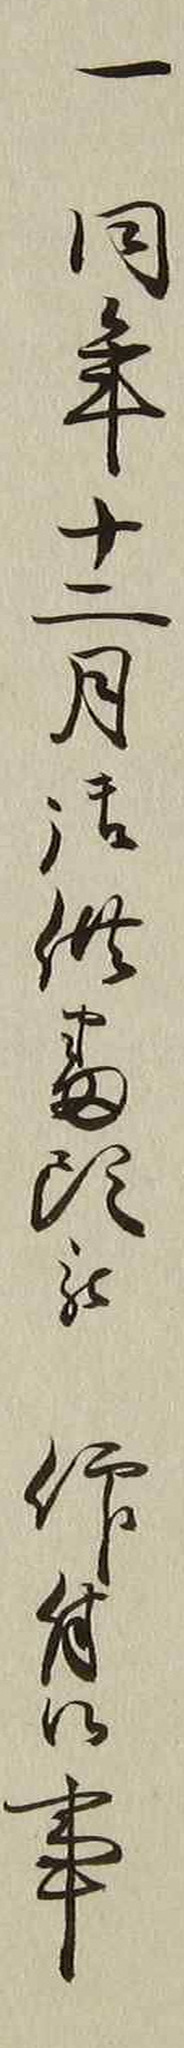一同年十二月御供番頭被仰付候事
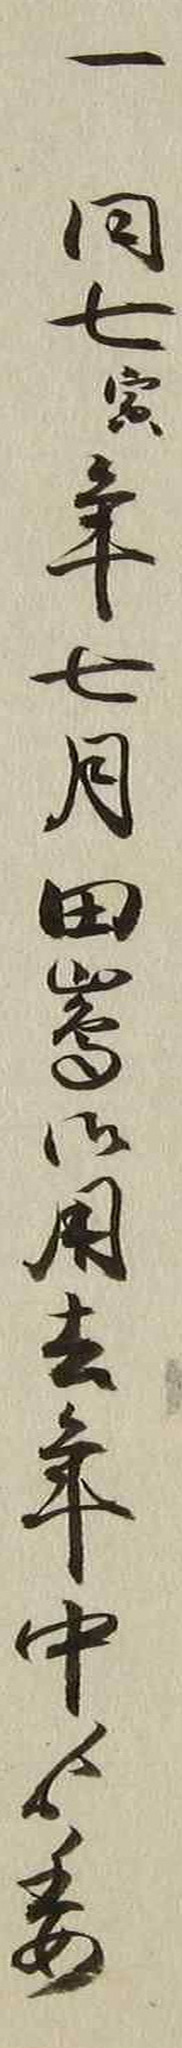一同七寅年七月田島御用去年中ゟ委
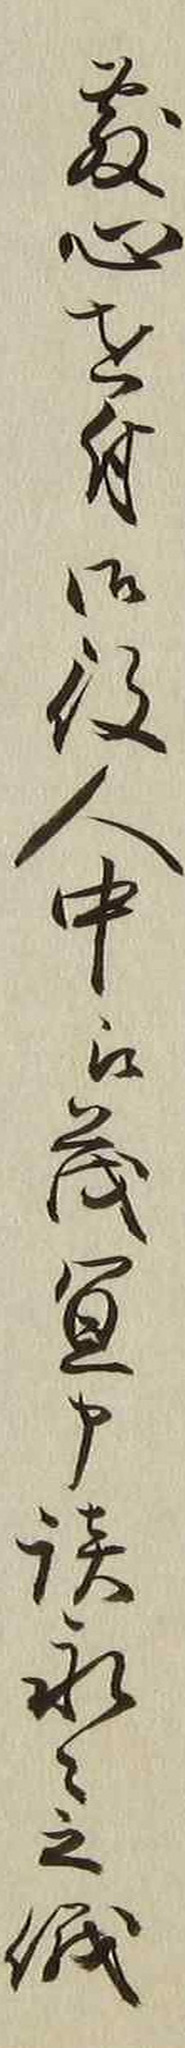敷心を付御役人中江も宜申談永々之儀
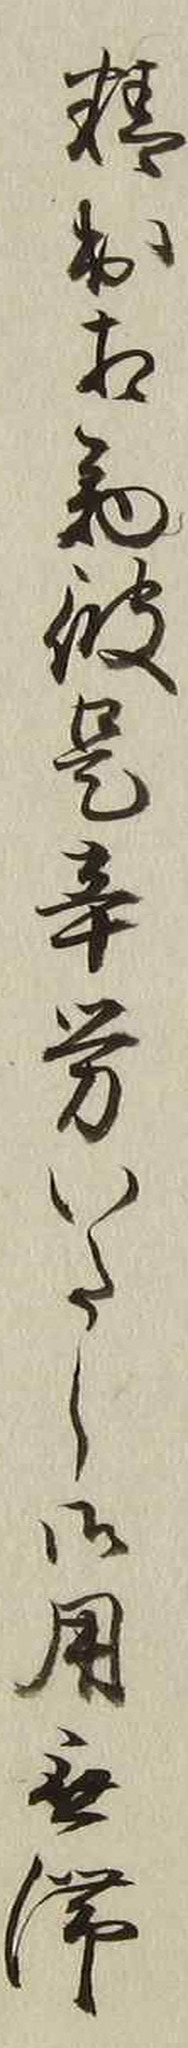精出相勤彼是辛労いたし御用無滞
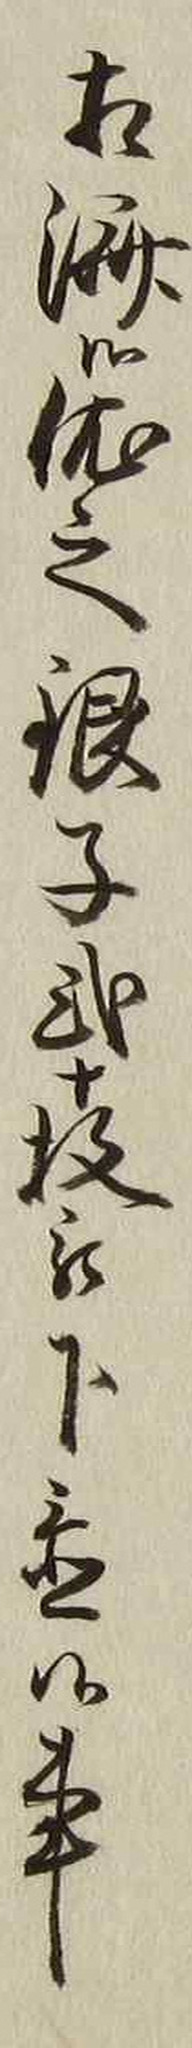相済候就之銀子弐十枚被下置候事
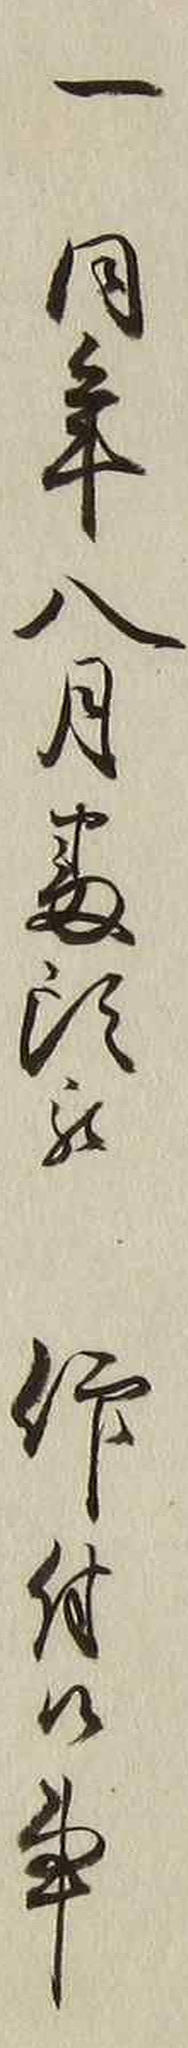一同年八月番頭被仰付候事
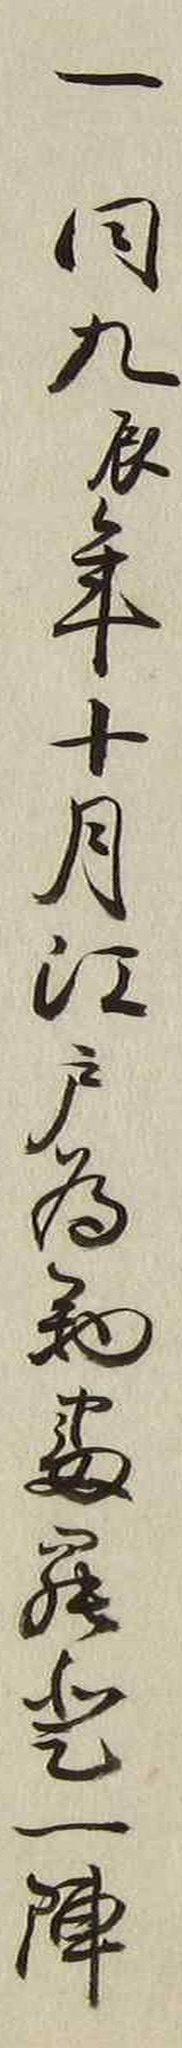一同九辰年十月江戸為勤番罷登一陣
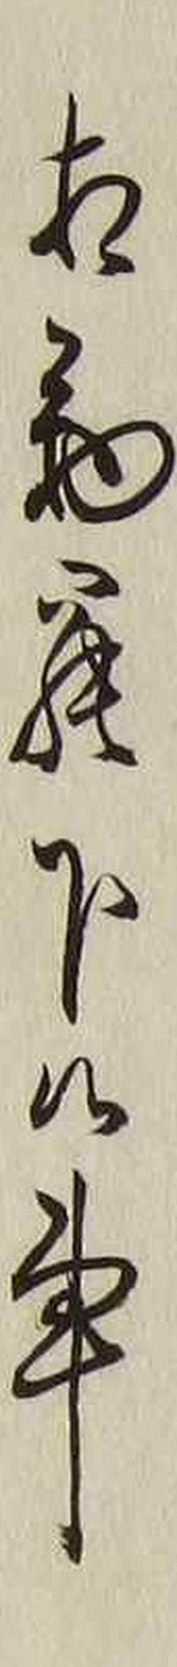相勤罷下候事
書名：諸士系譜　巻之15　い之部15
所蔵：会津若松市立会津図書館
